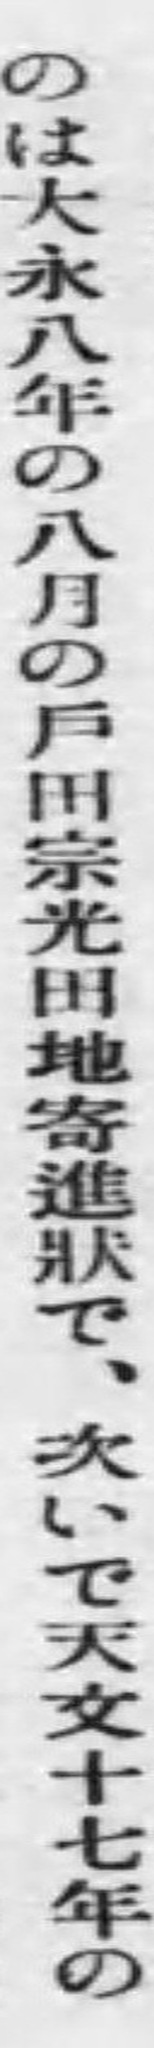のは大永八年の八月の戸田宗光田地寄進状で、次いで天文十七年の
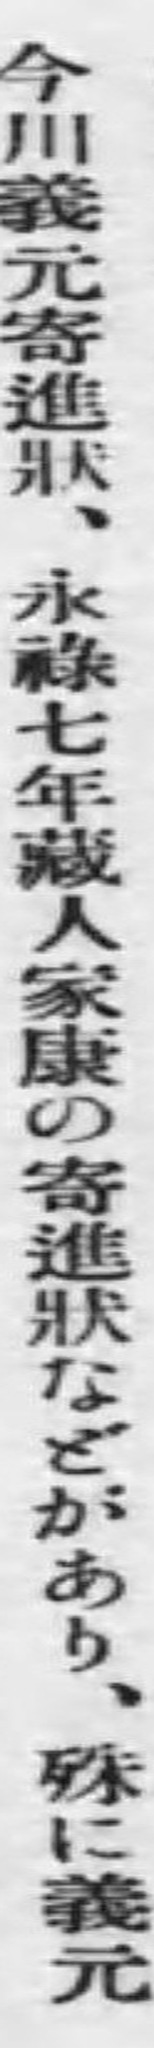今川義元寄進状、永禄七年蔵人家康の寄進状などがあり、殊に義元
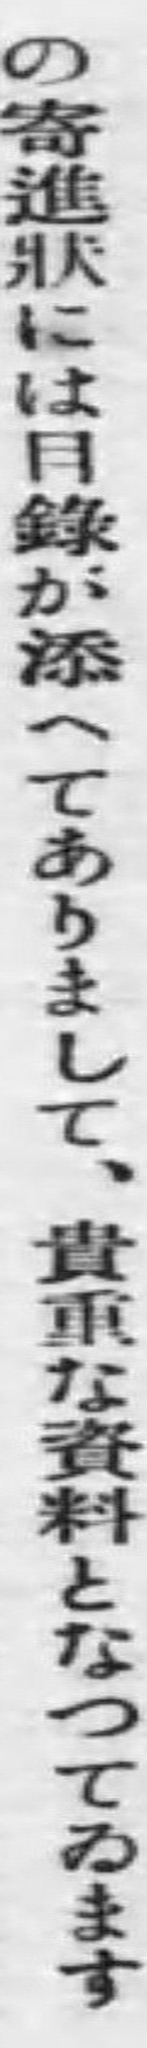の寄進状には目録が添へてありまして、貴重な資料となつてゐます
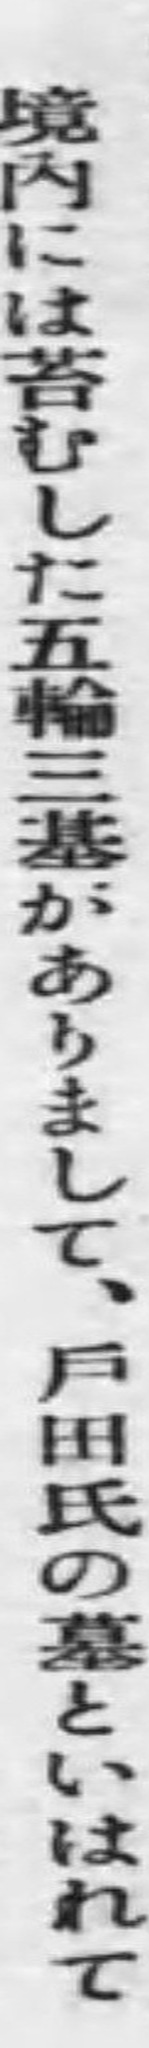境内には苔むした五輪三基がありまして、戸田氏の墓といはれて
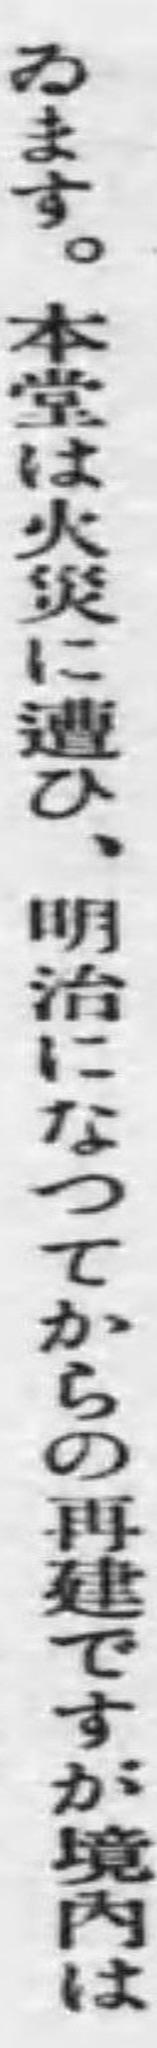ゐます。本堂は火災に遭ひ、明治になつてからの再建ですが境内は

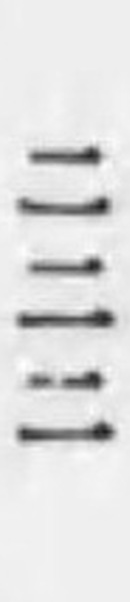二二二
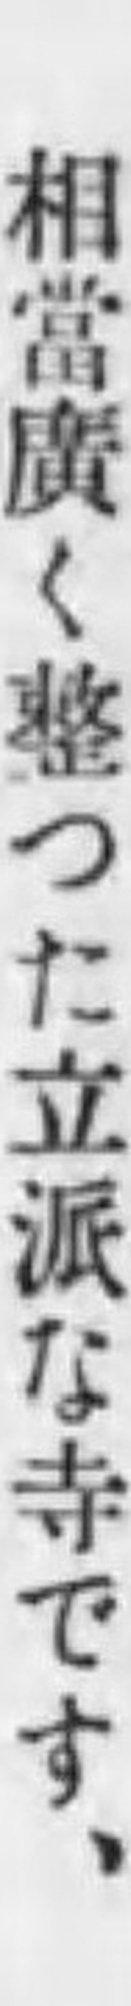相当広く整つた立派な寺です、
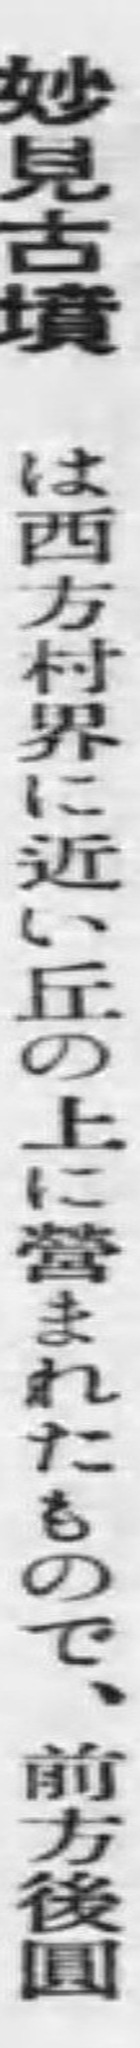妙見古墳は西方村界に近い丘の上に営まれたもので、前方後円
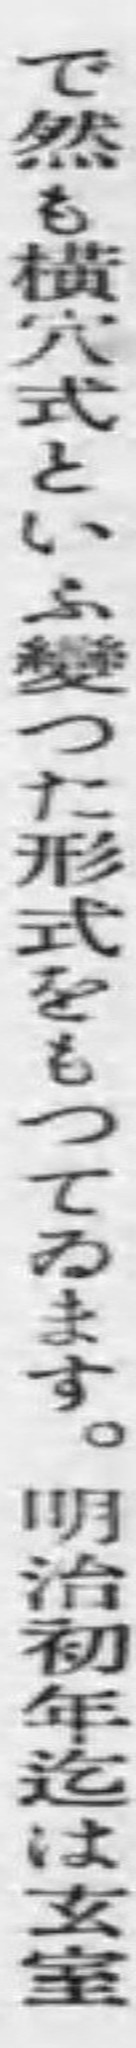で然も横穴式といふ変つた形式をもつてゐます。明治初年迄は玄室
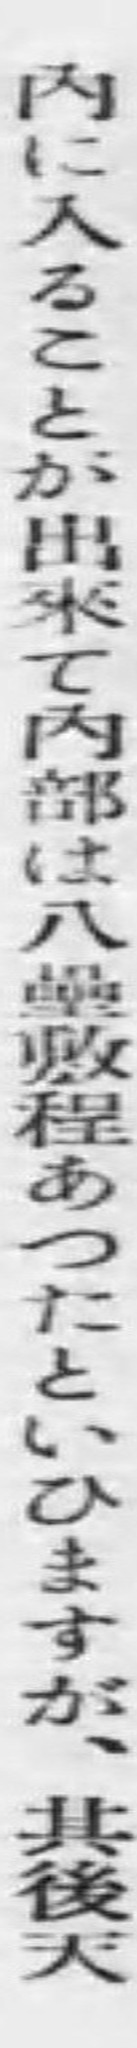内に入ることが出来て内部は八塁敷程あつたといひますが、其後天
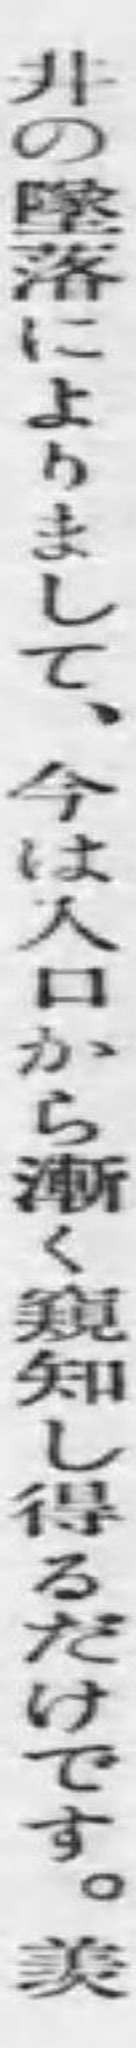井の墜落によりまして、今は入口から漸く窺知し得るだけです。羨
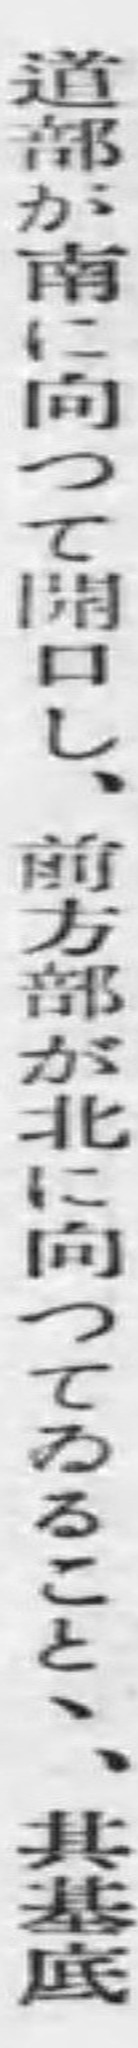道部が南に向つて開口し、前方部が北に向つてゐることゝ、其基底
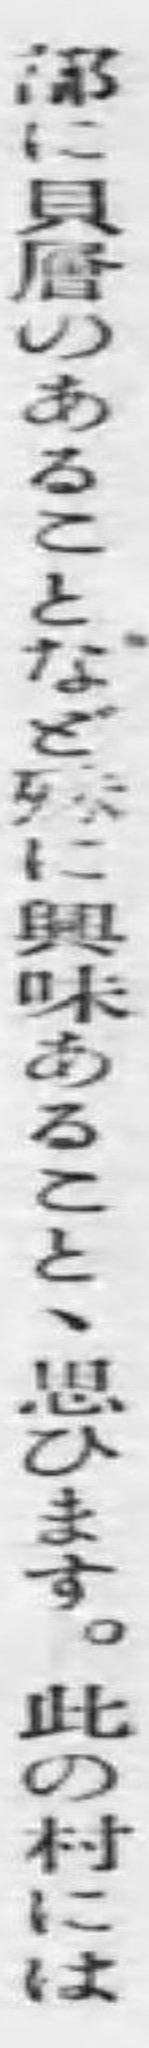部に貝層のあることなど殊に興味あることゝ思ひます。此の村には
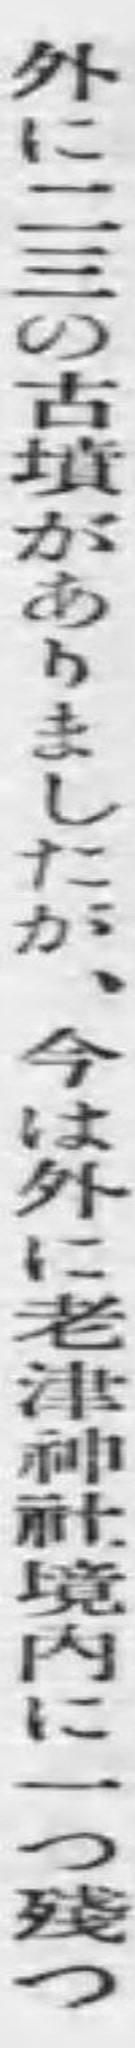外に二三の古墳がありましたが、今は外に老津神社境内に一つ残つ
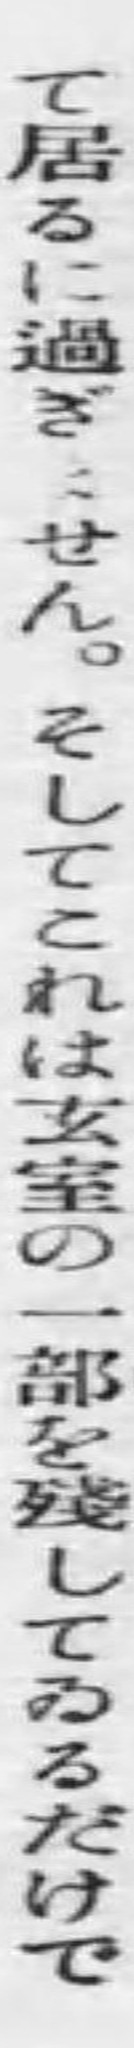て居るに過ぎません。そしてこれは玄室の一部を残してゐるだけで
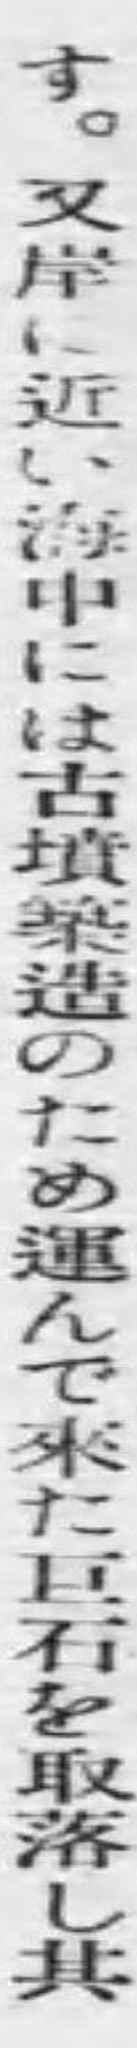す。又岸に近い海中には古墳築造のため運んで来た巨石を取落し其
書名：東三河道中記 : 豊橋市及其附近案内
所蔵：国立国会図書館 National Diet Library, JAPAN
